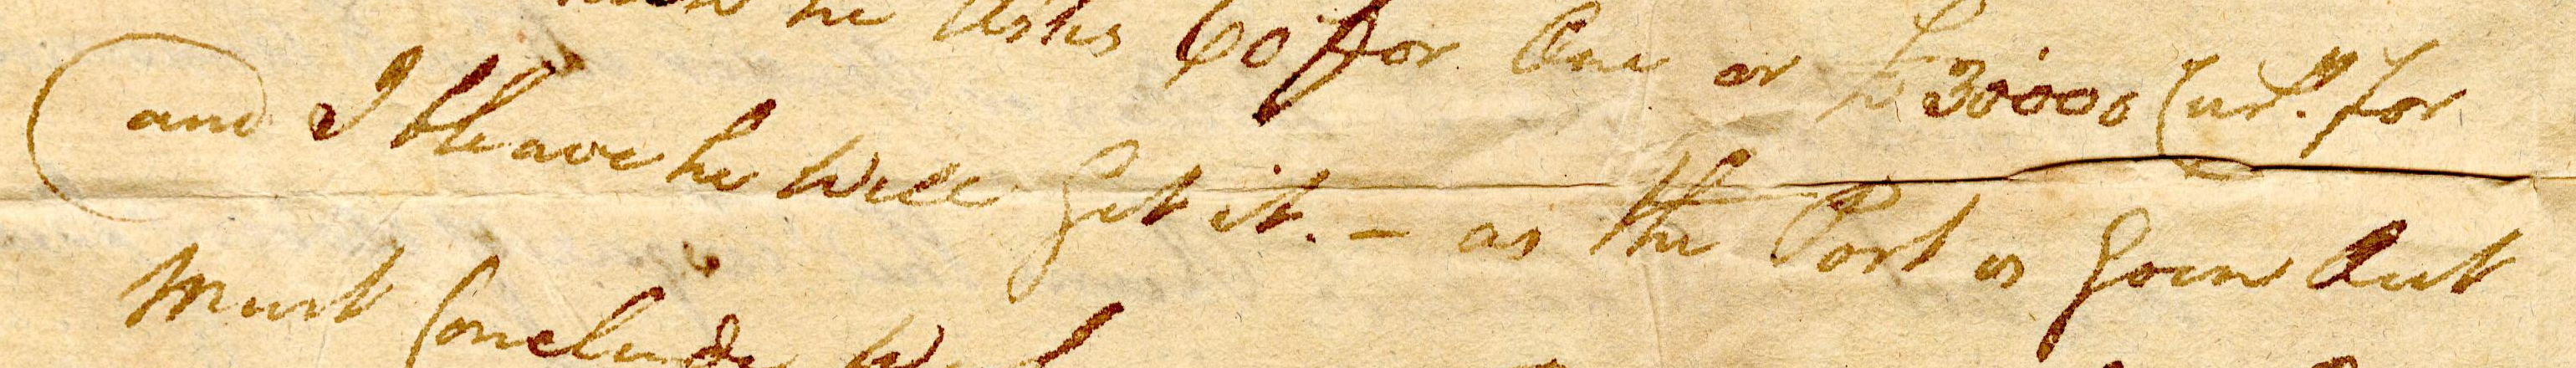and I bleave he will get it.- as the Port is goen but
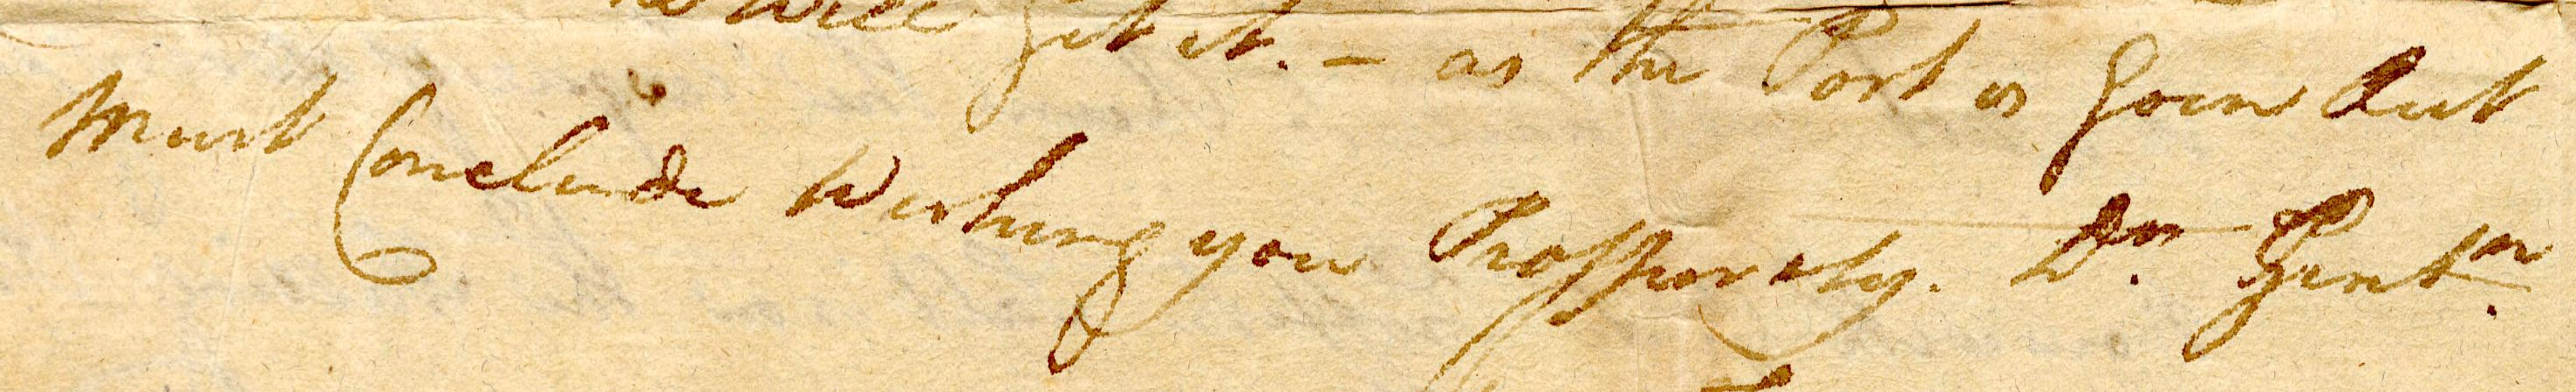must conclude Writing you Prospority. D^r. Gent^n.
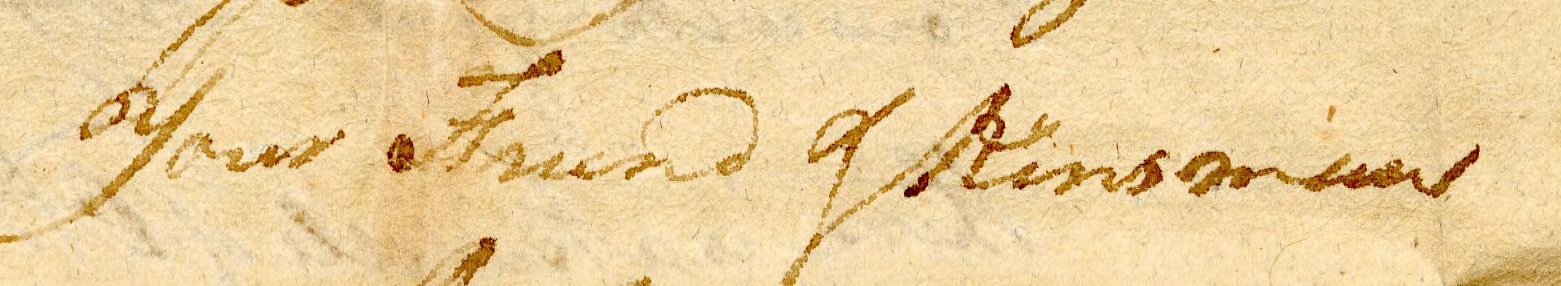Your Friend & Kinsman
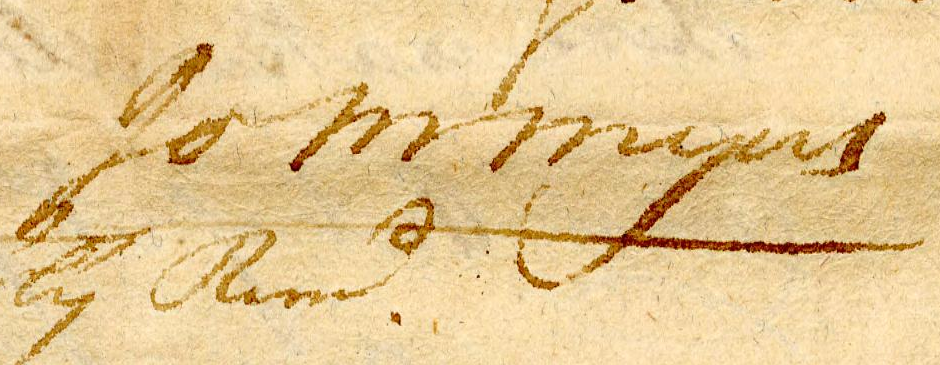Jo M Myers
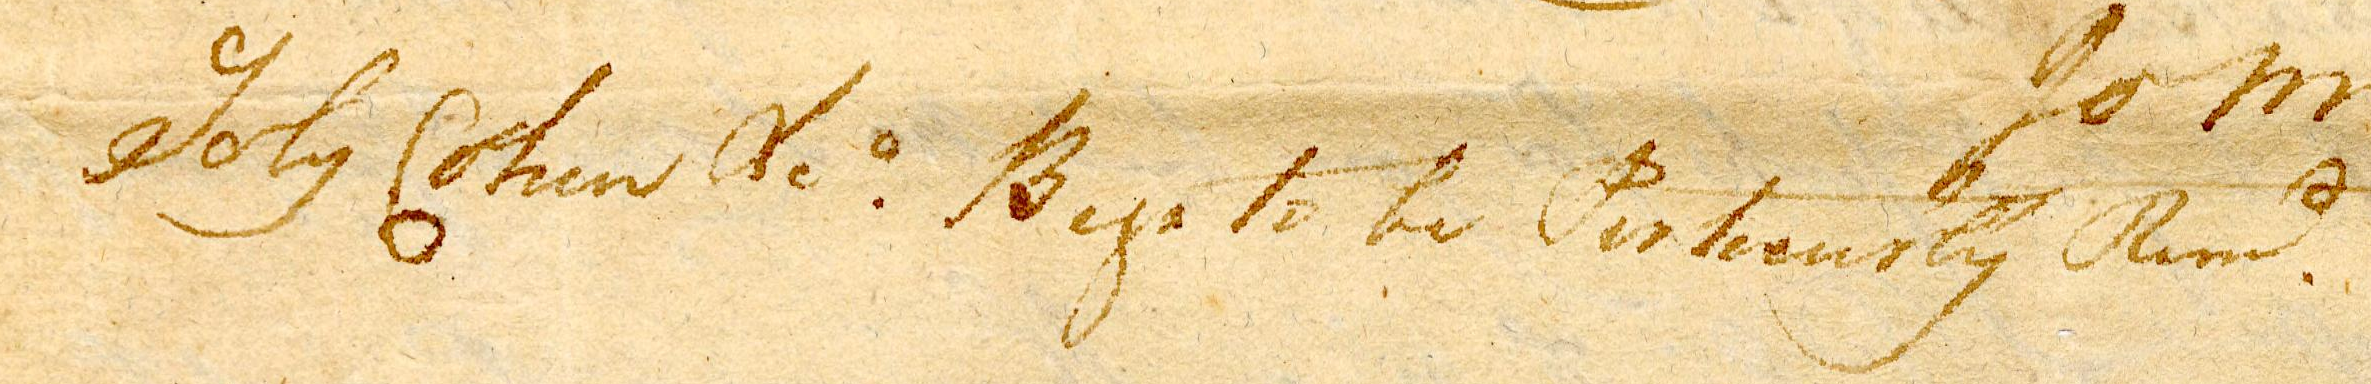Joly Cohen &c. Begs to be Perticurly Rem^d.
